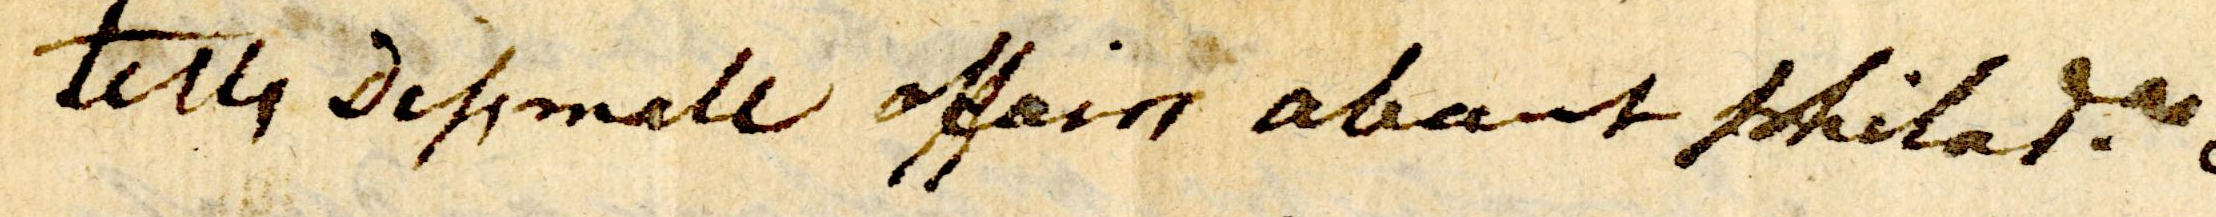tells dissmall affairs about philad^a.
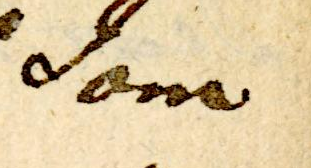I am
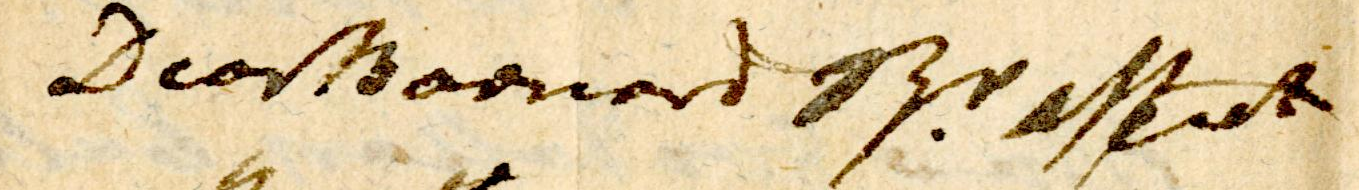Dear Barnard y^r. affect
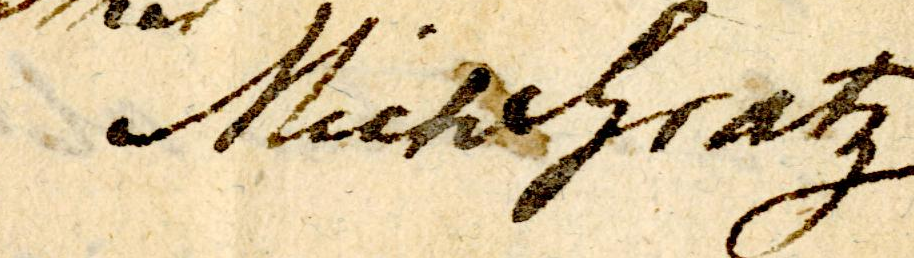Miche^l Gratz
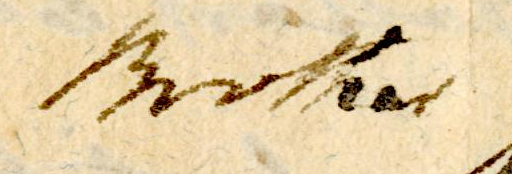Brother
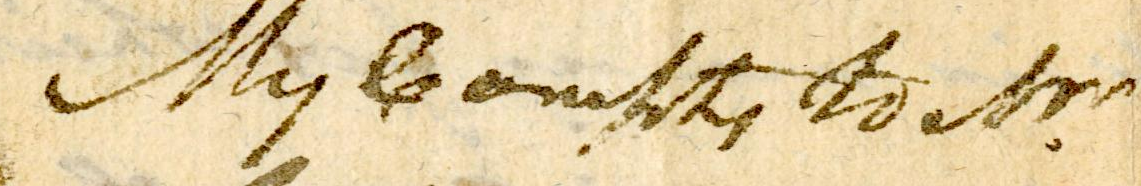My Compts to M^r.
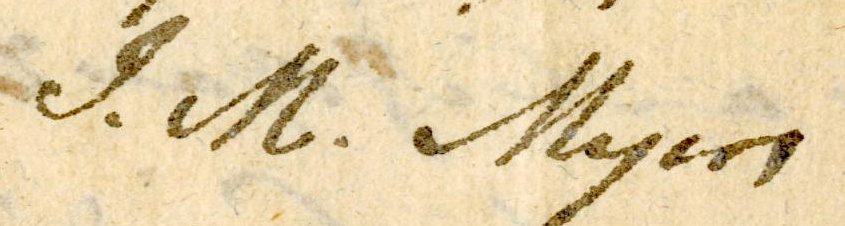S. M. Myers
